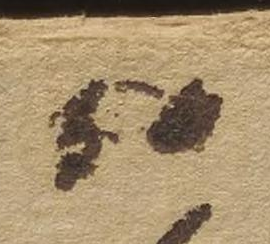50
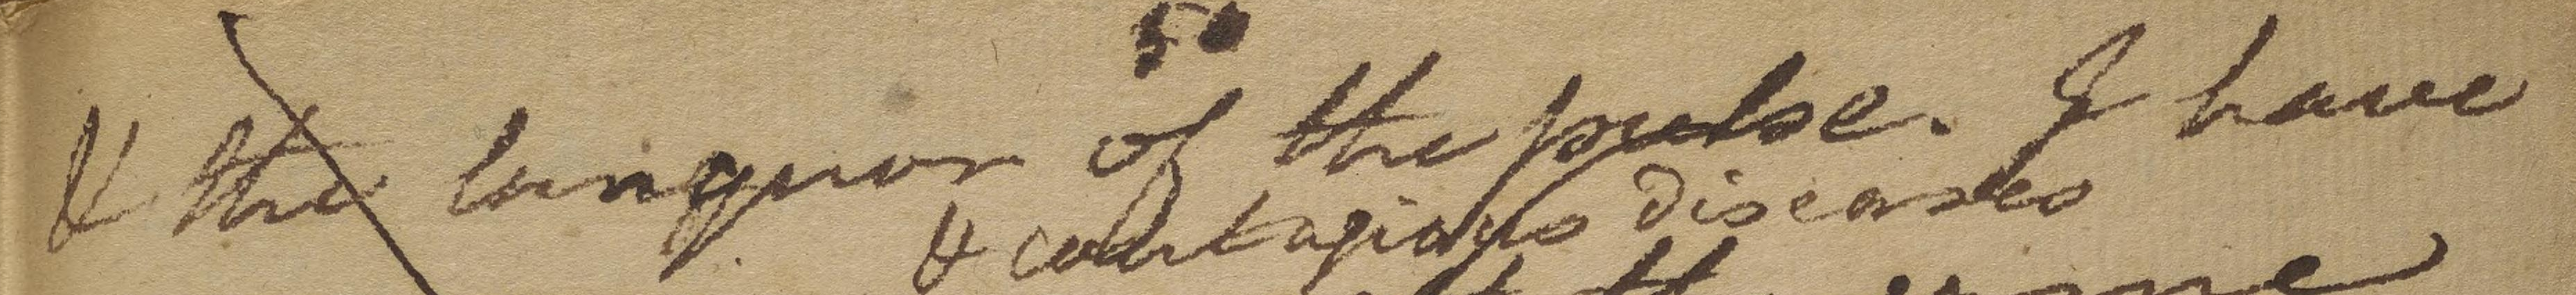& the languor of the pulse. I have
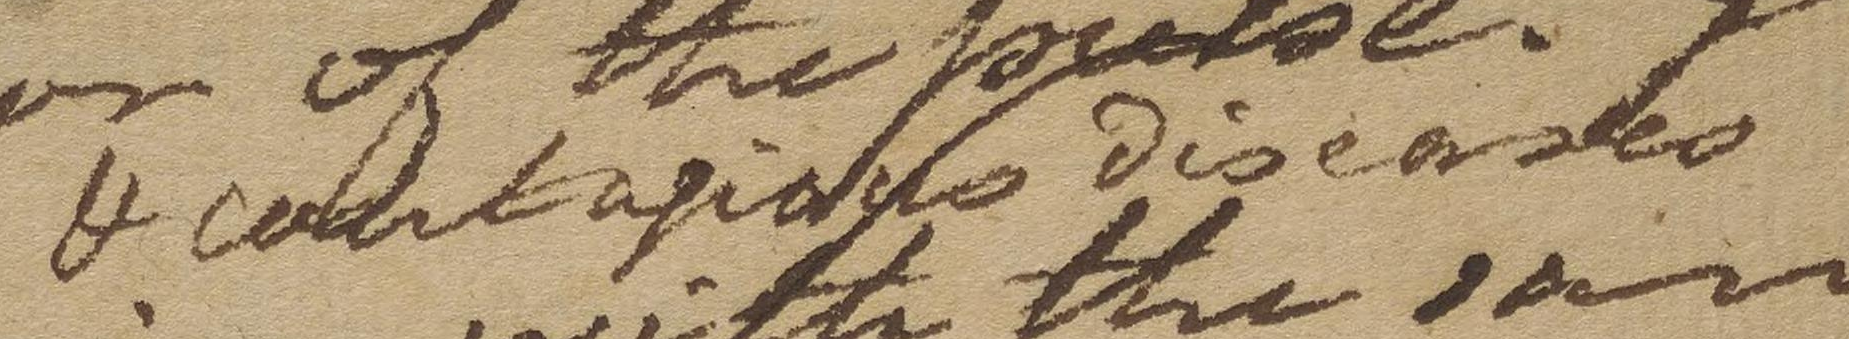& contagious diseases
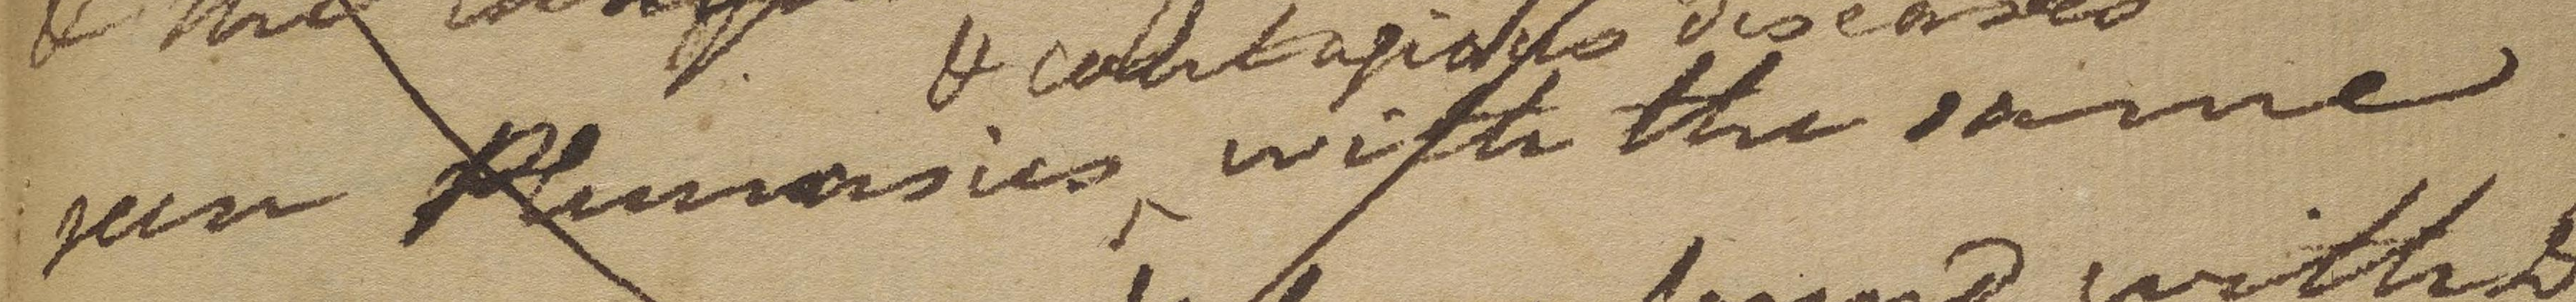seen Pleurasies ^ with the same
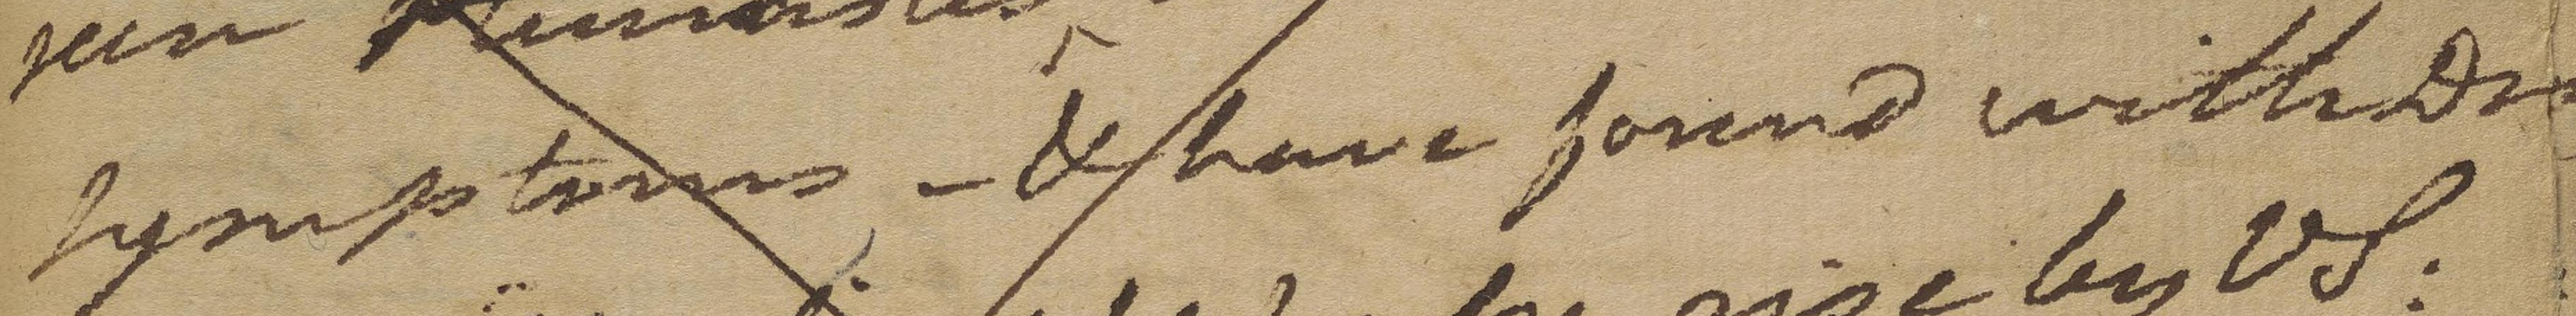symptoms, & have found with D^r
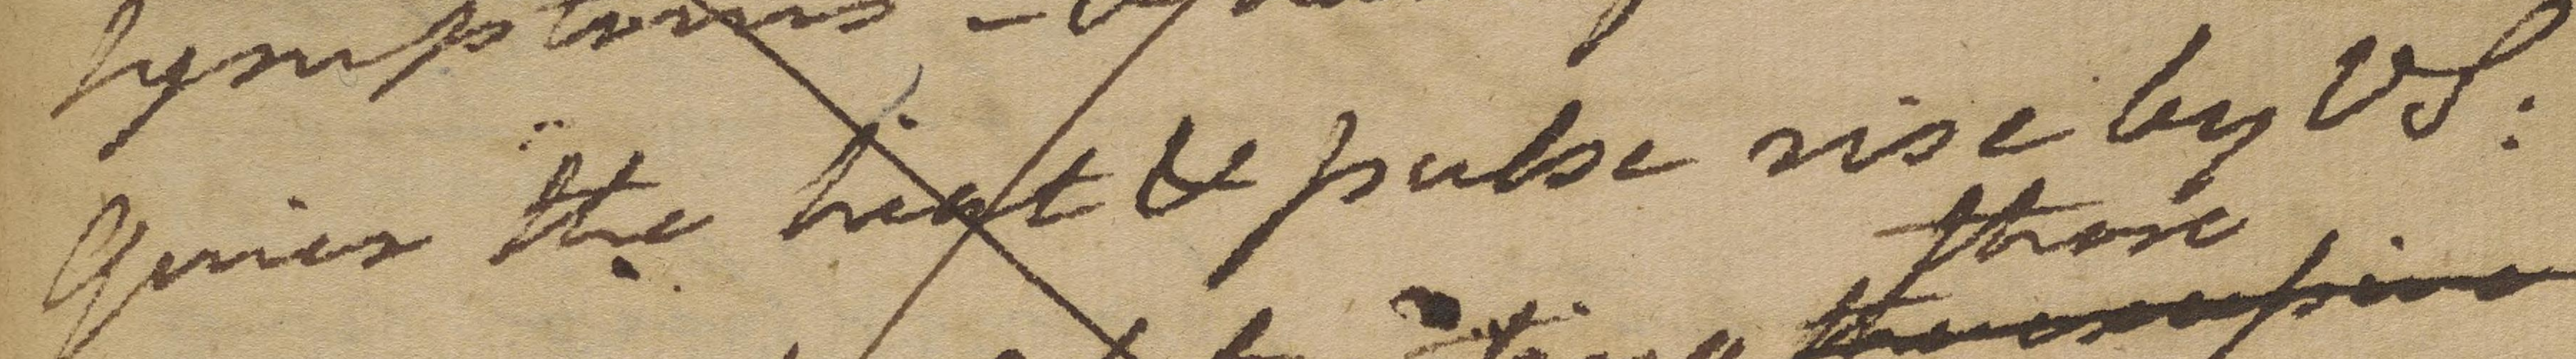Grier the heat & pulse rise by US.
